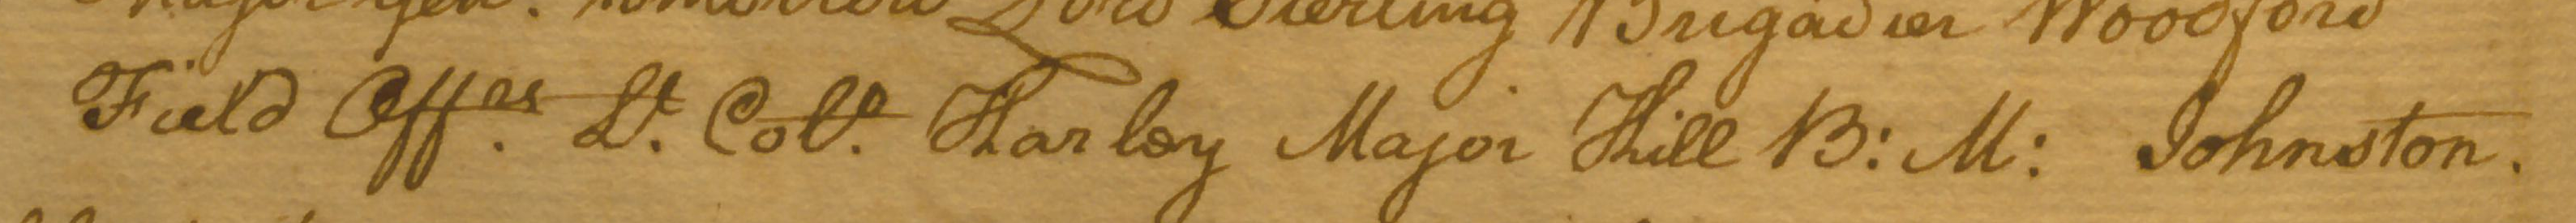Field Off^rs. L^t. Col^o. Harley Major Hill B: M: Johnston.
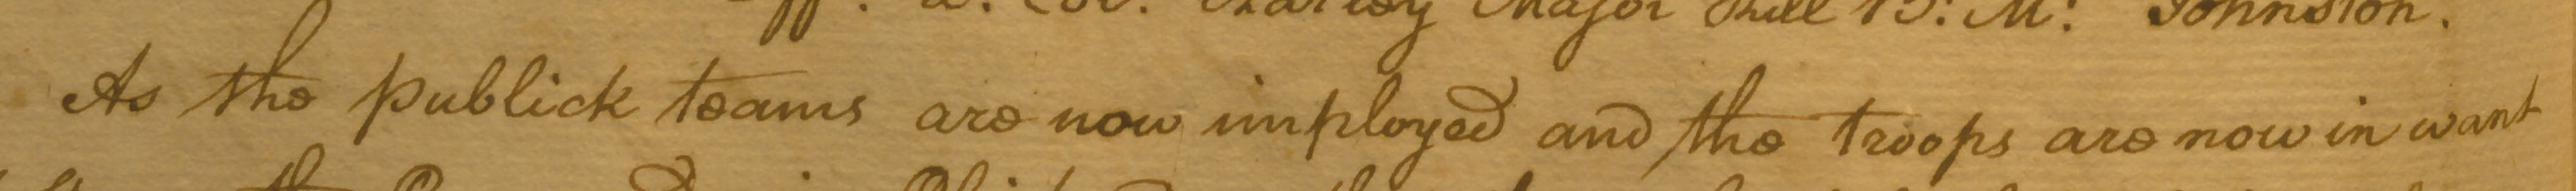As the publick teams are now imployed and the troops are now in want
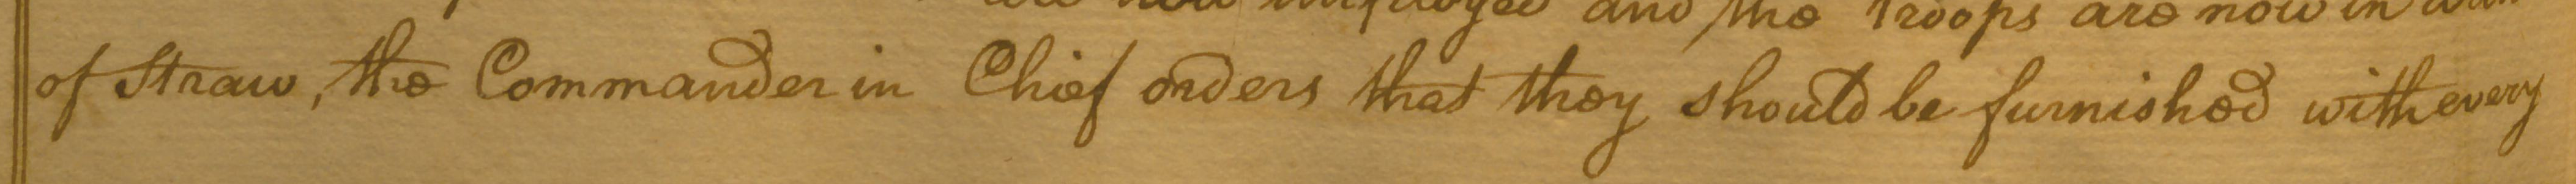of Straw, the Commander in Chief orders that they should be furnished with every
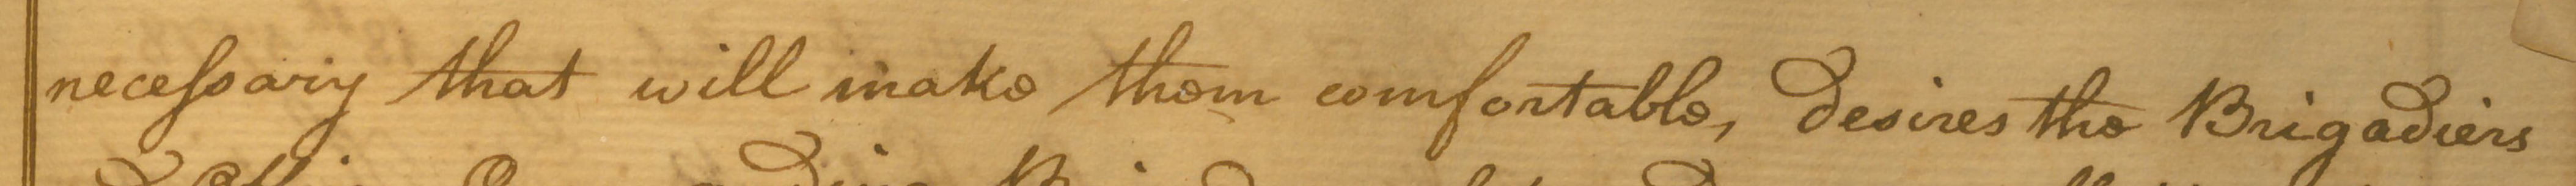necessary that will make them comfortable, desires the Brigadiers
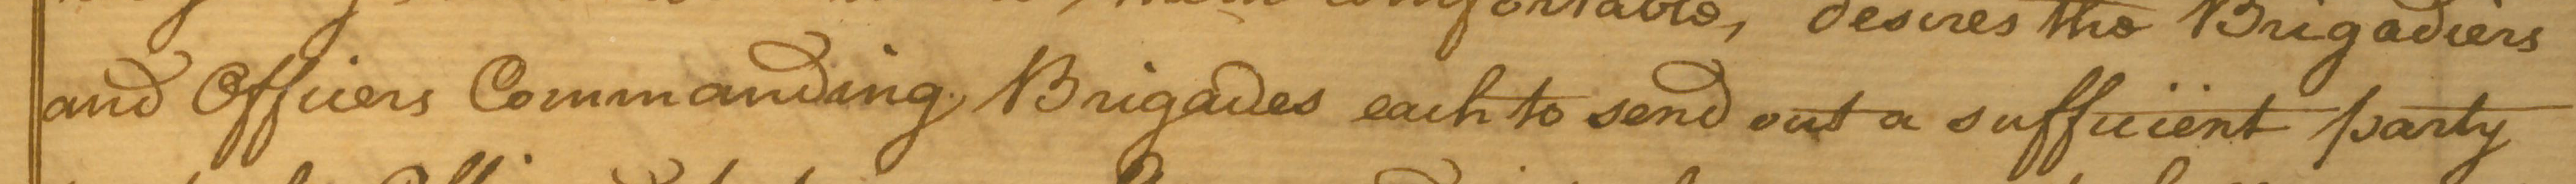and Officers Commanding Brigades each to send out a sufficient party
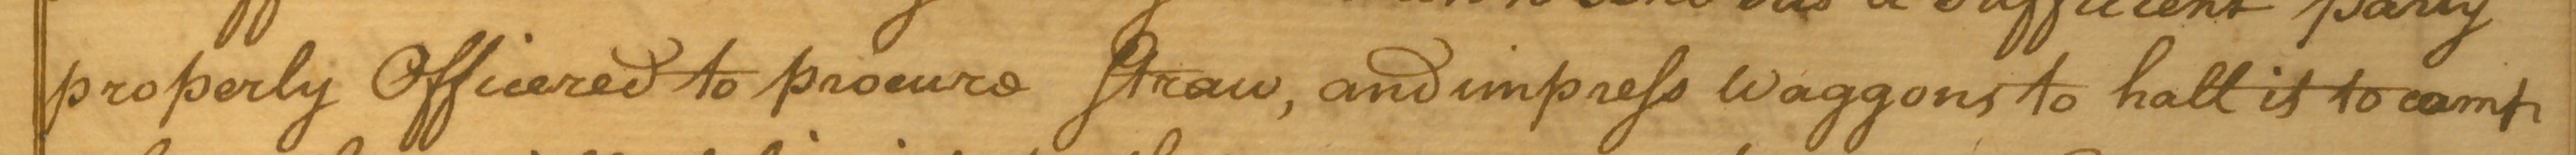properly Officered to procure Straw, and impress waggons to hall it to camp
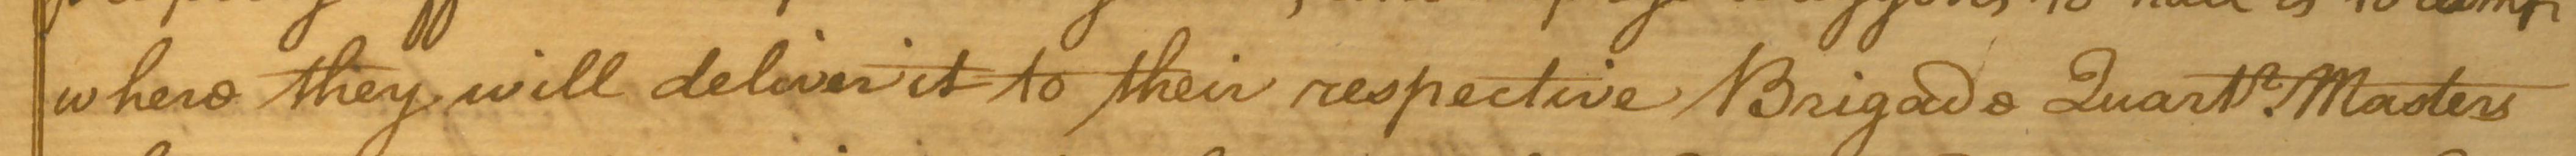where they will deliver it to their respective Brigade Quart^r. Masters
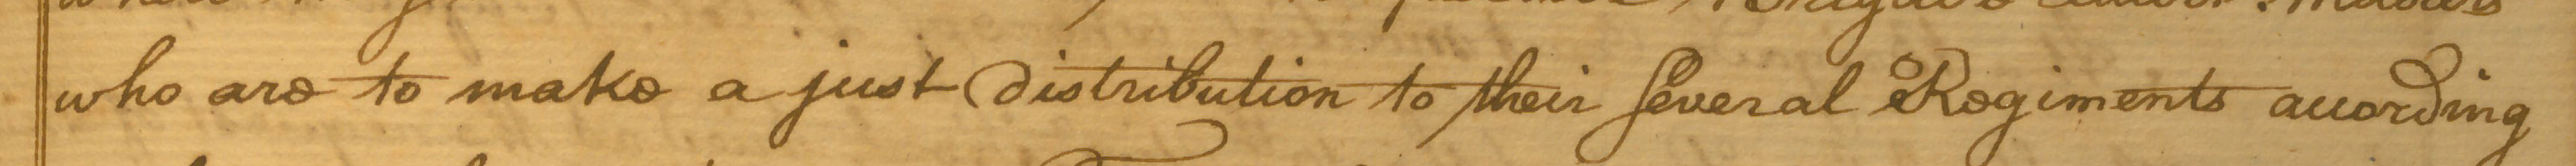who are to make a just distribution to their several Regiments according
